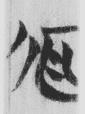佴
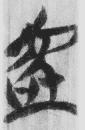唬
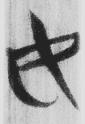女
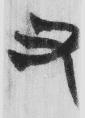又
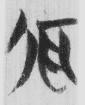佴
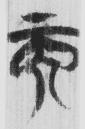而
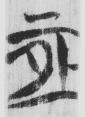亙
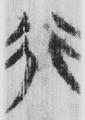行
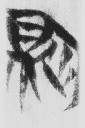則
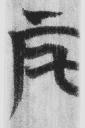厇
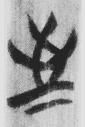至
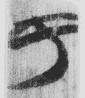于
